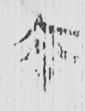{六十}
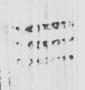三
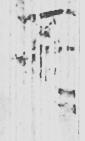五十=
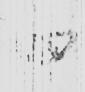四
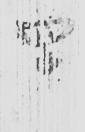{四十}
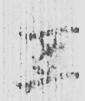五
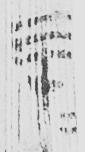三十=
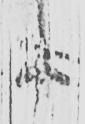六
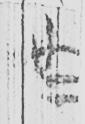廿=
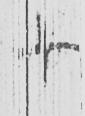七
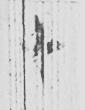十
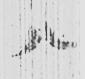八
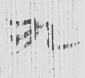九
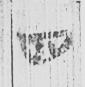四
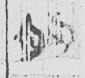刖
